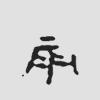雨
